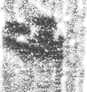又（有）
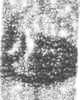首
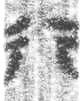行
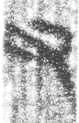又（有）
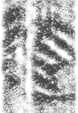道
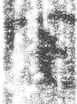厇
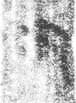又（有）
